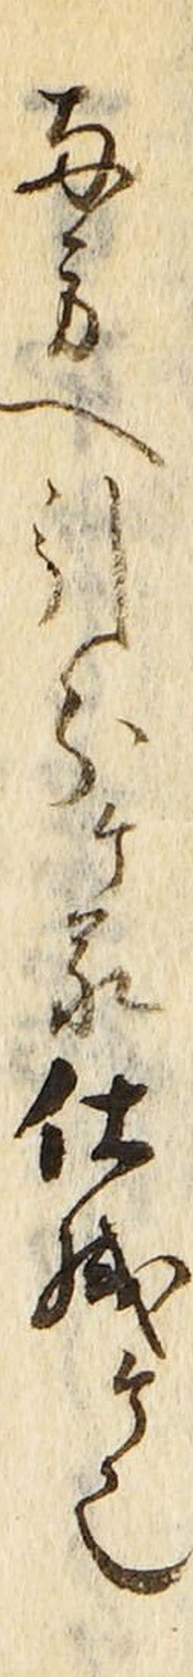両方へ引分ヶる仕掛ヶ也
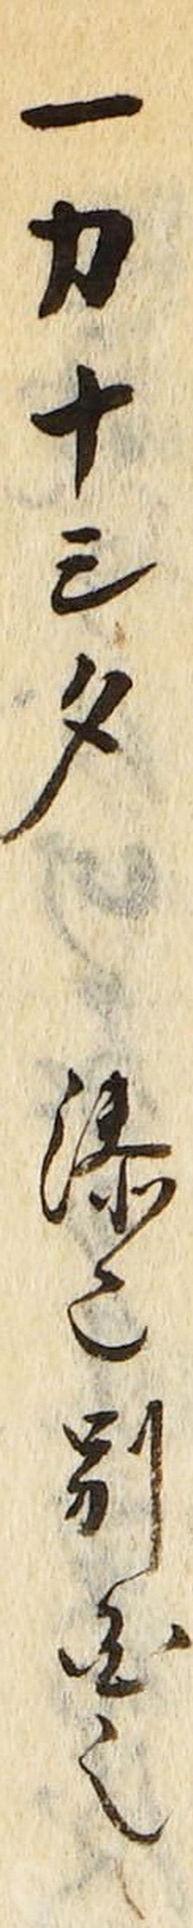一カナシタ湊成別国也
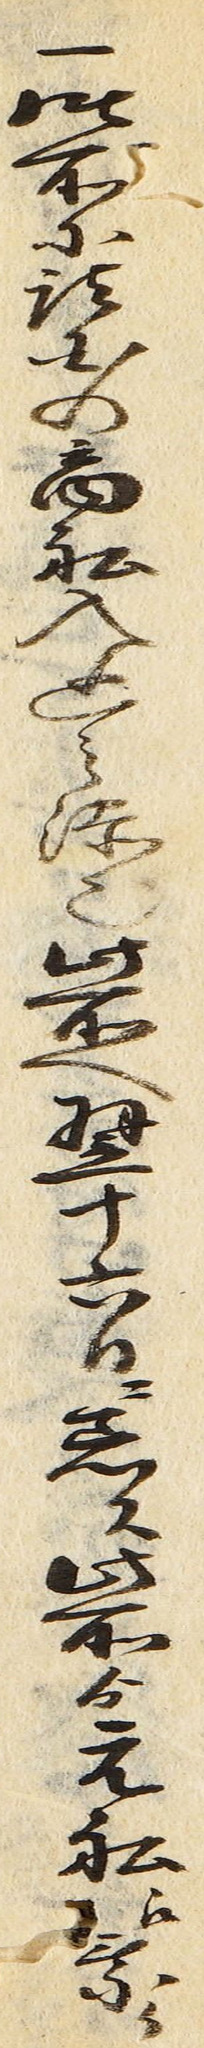一此所に諸国の商船入込之湊也此所へ翌十六日に着す此所ゟ元船え乗り
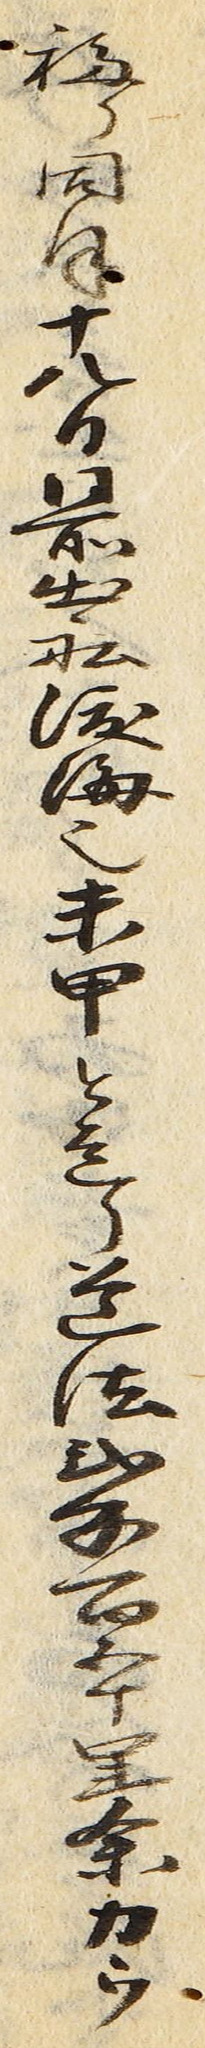移り同月十八日同所出船渡海也未甲と走り道法弐千百五十里余カウ
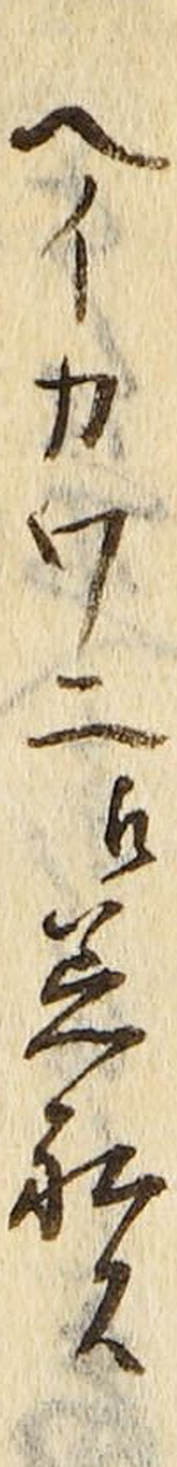ヘイカワニえ着船す
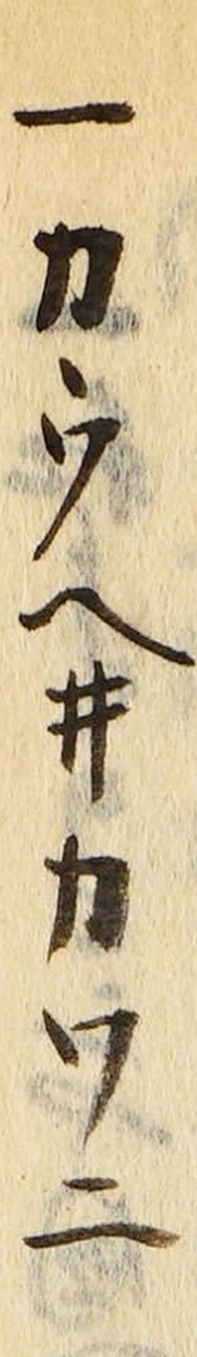一カウヘヰカワニ
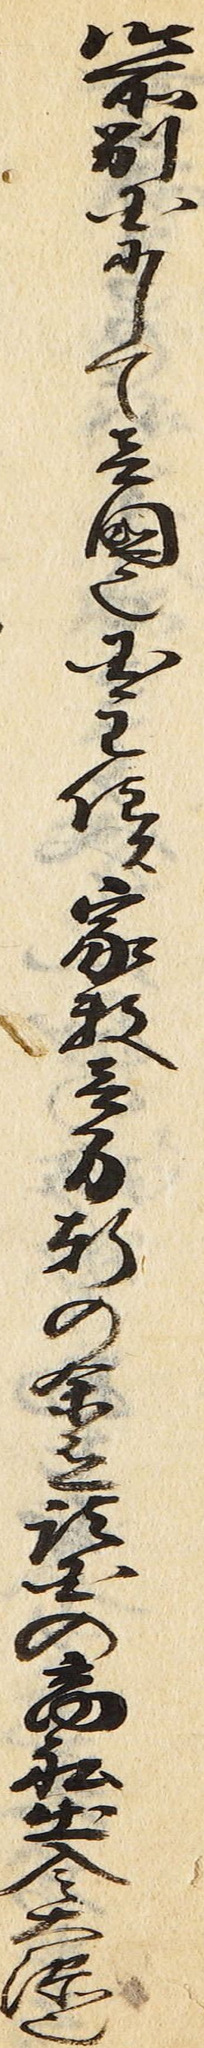此所別国にして壱国也国主住す家数壱万軒の余有諸国の商船出入之大湊也
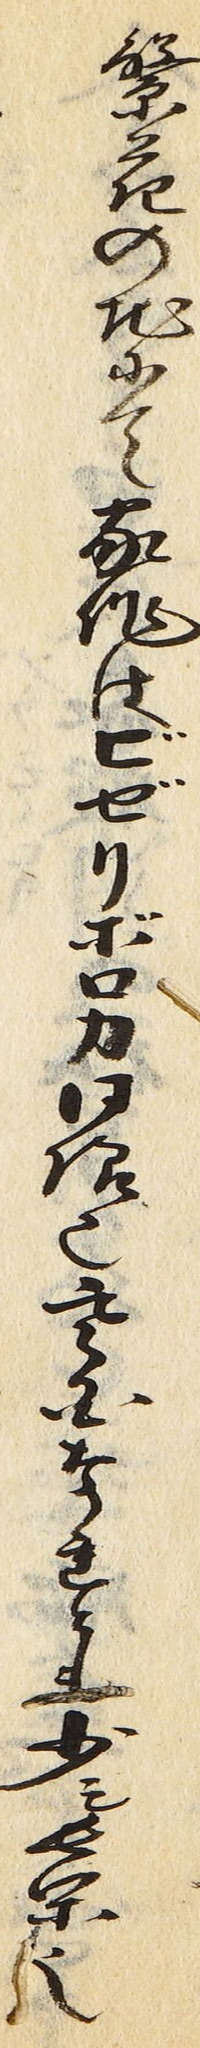繁花の地にて家作ビゼリボロカ同様也寒国なれとも少し長閑也
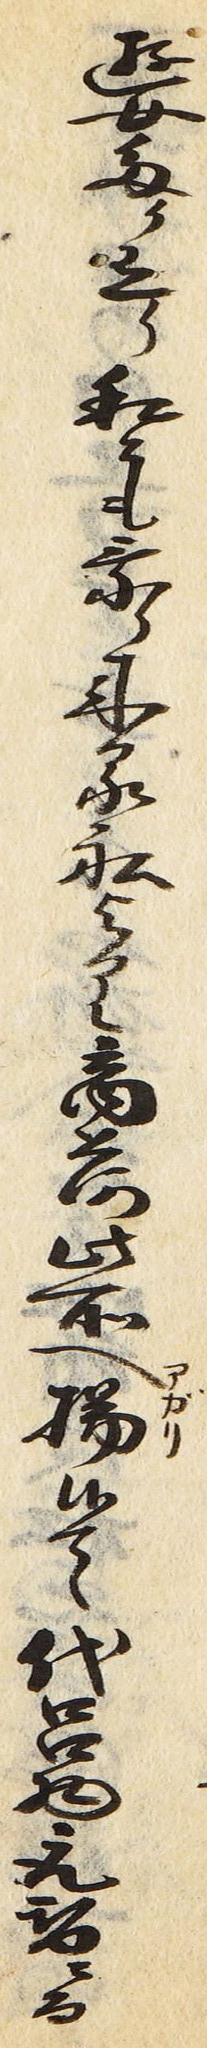遊女多く有り私とも乗り来る船より商荷此所へ揚候て代呂物取替に而
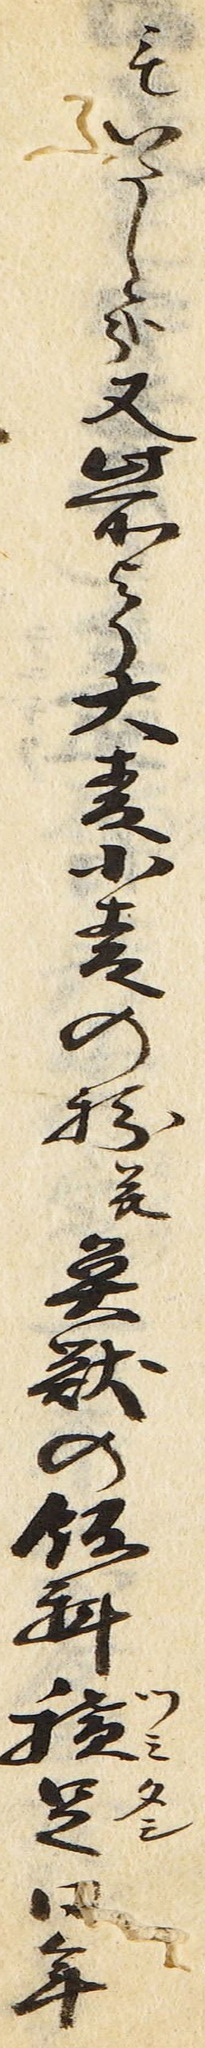もいたしと哉又此所より大麦小麦の粉并魚獣の飯料積足同年
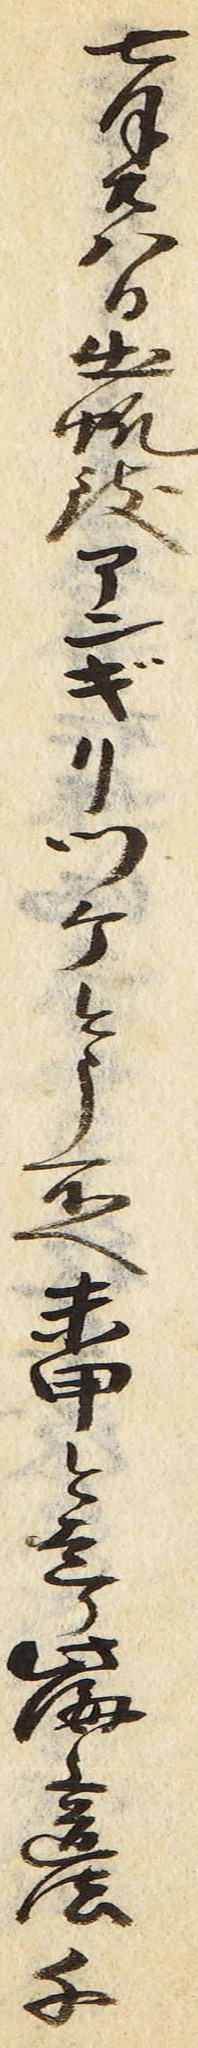七月廿八日出帆致アンギリツケと申所へ未甲と走り此海上道法千
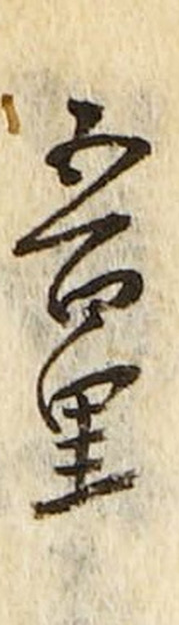五百里
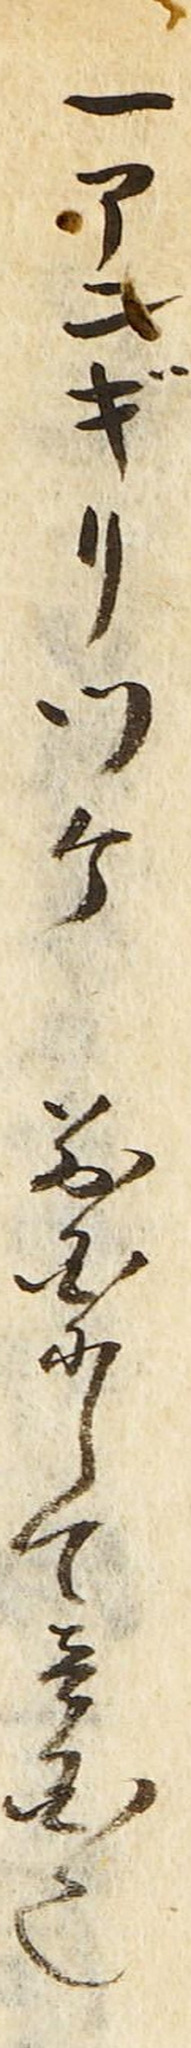一アンギリツケ別国にして壱国也
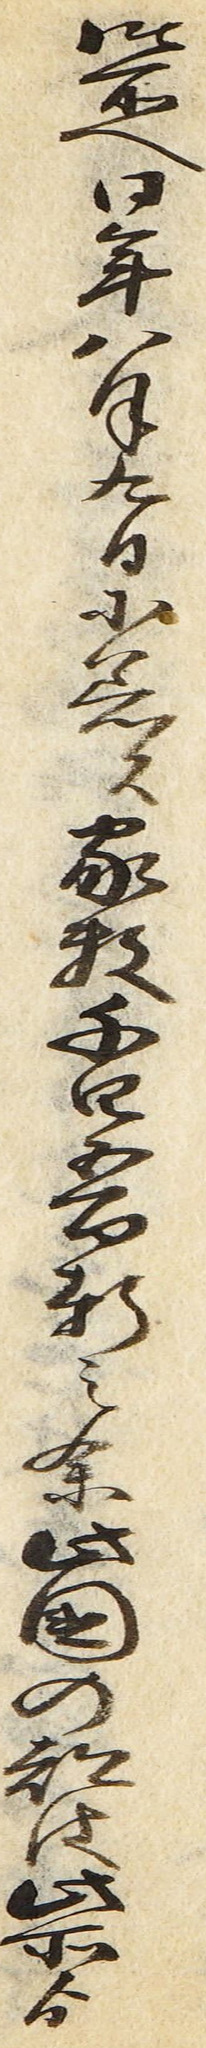此所へ同年八月九日に着す家数千四五百軒之余此国の都は此所ゟ
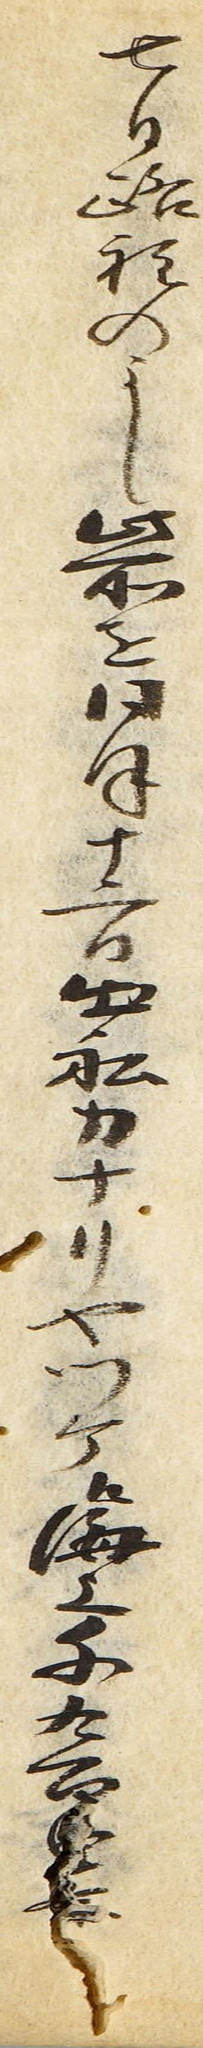七日路程のよし此所を同月十二日出船カナリヤツケえ海上千九百
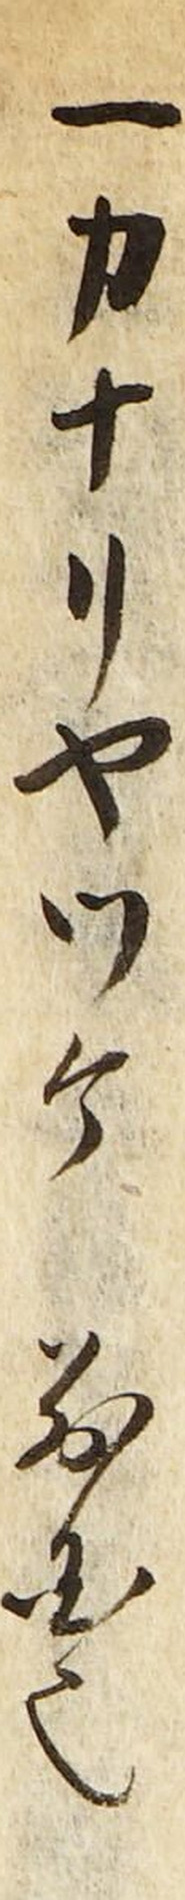一カナリヤツケ別国也
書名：外国漂流記
